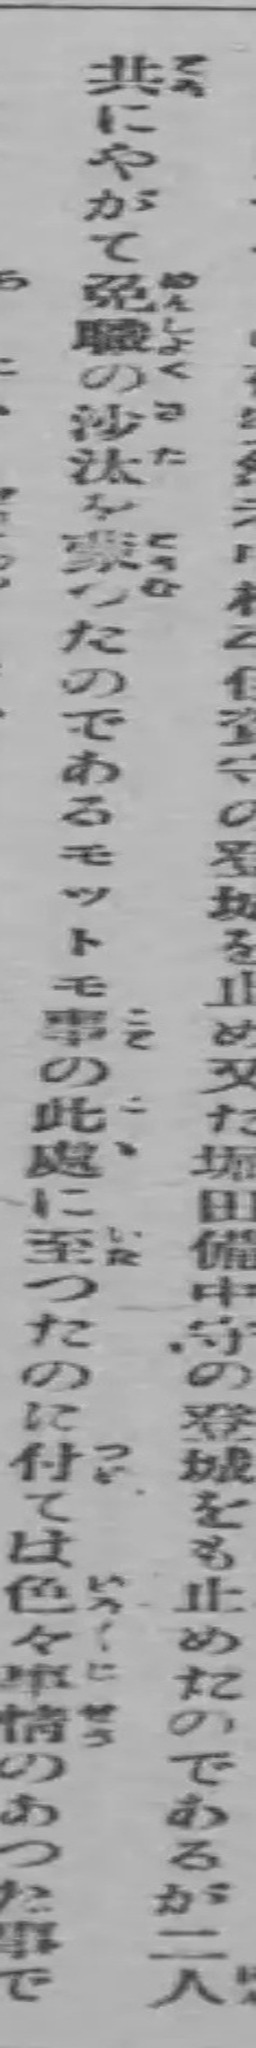共にやがて免職の沙汰を蒙つたのであるモツトモ事の此処に至つたのに付ては色々事情のあつた事で
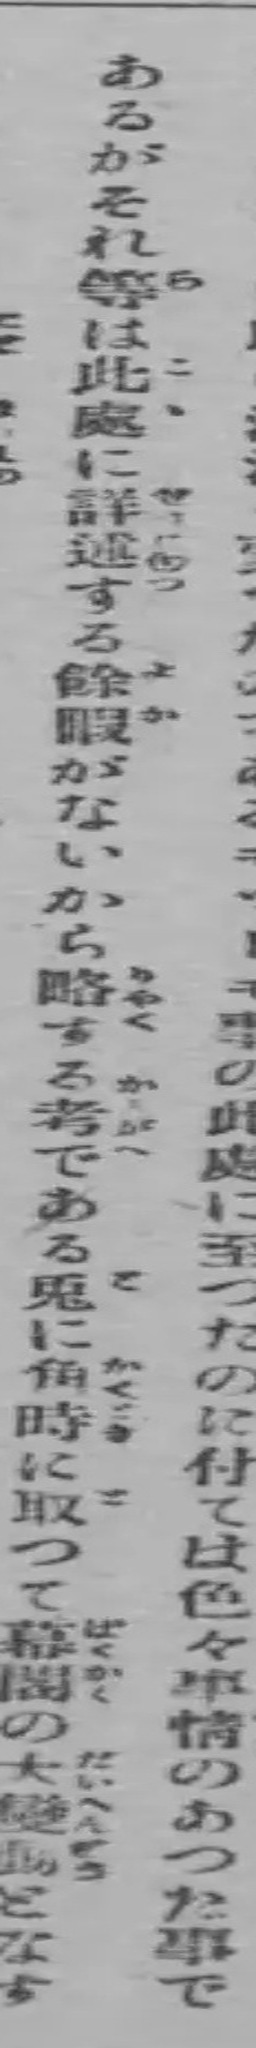あるがそれ等は此処に詳述する余暇がないから略する考である兎に角時に取つて幕閣の大変動となす
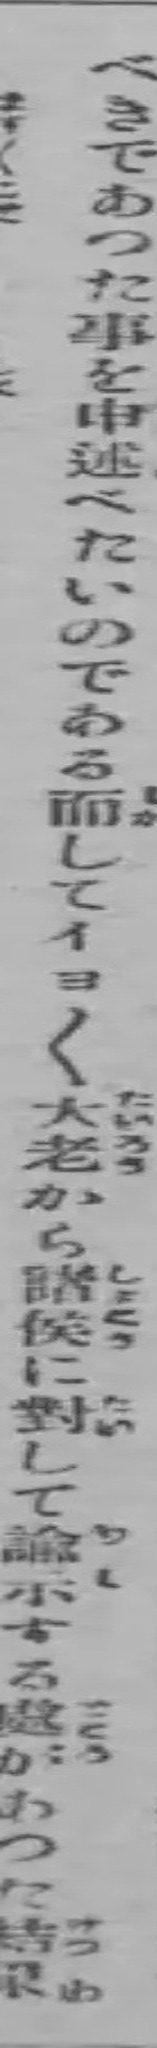べきであつた事を申述べたいのである而してイヨ〳〵大老から諸侯に対して諭示する処があつた結果
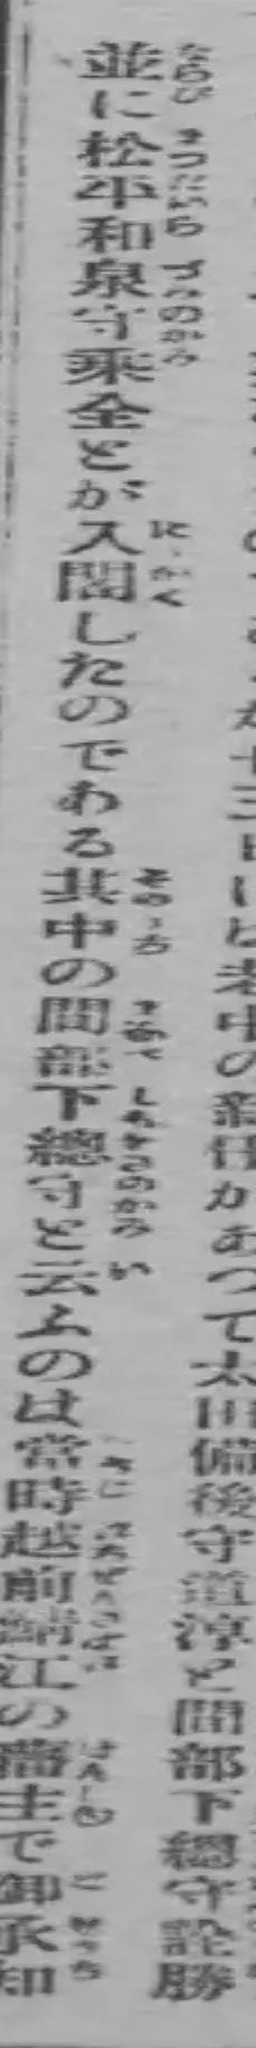並に松平和泉守乗全とが入閣したのである其中の間部下総守と云ふのは当時越前鯖江の藩主で御承知
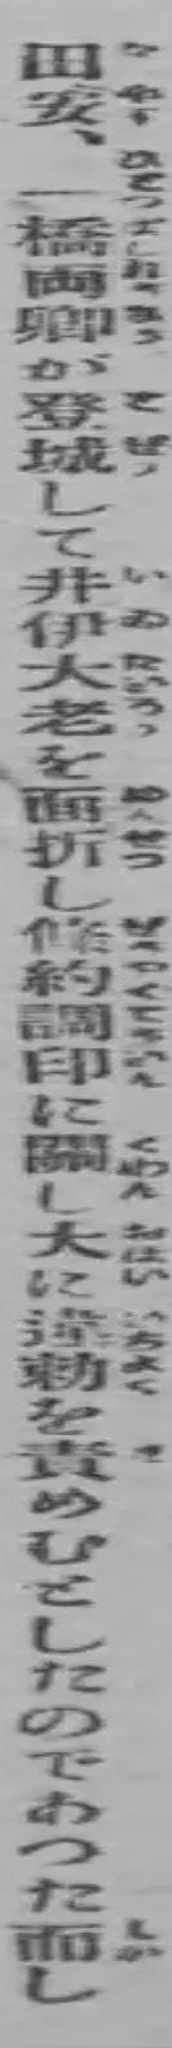田安、一橋両卿が登城して井伊大老を面折し条約調印に関し大に違勅を責めむとしたのであつた而し
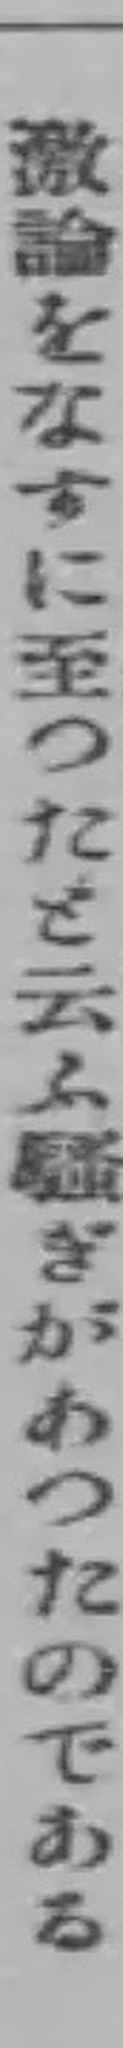激論をなすに至つたと云ふ騒ぎがあつたのである
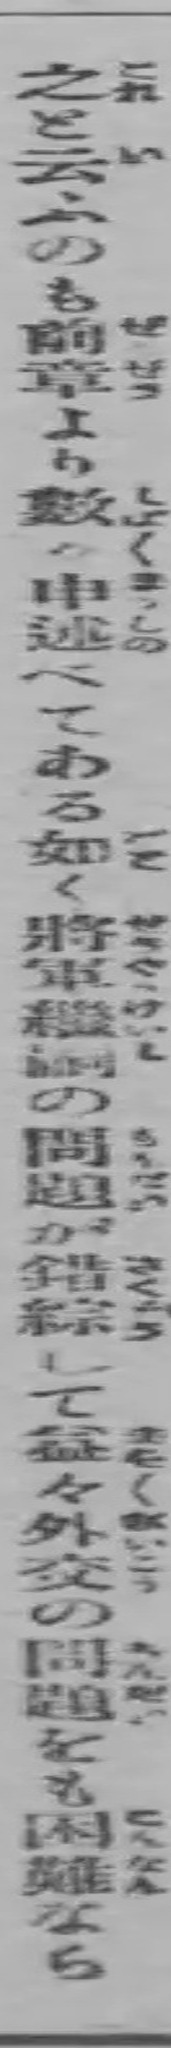之と云ふのも前章より数々申述べてある如く将軍継嗣の問題が錯綜して益々外交の問題をも困難なら
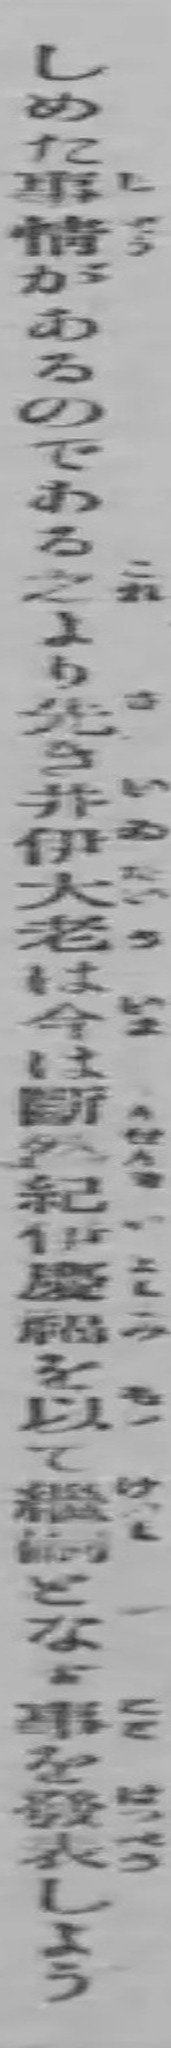しめた事情があるのである之より先き井伊大老は今は断然紀伊慶福を以て継嗣となす事を発表しよう
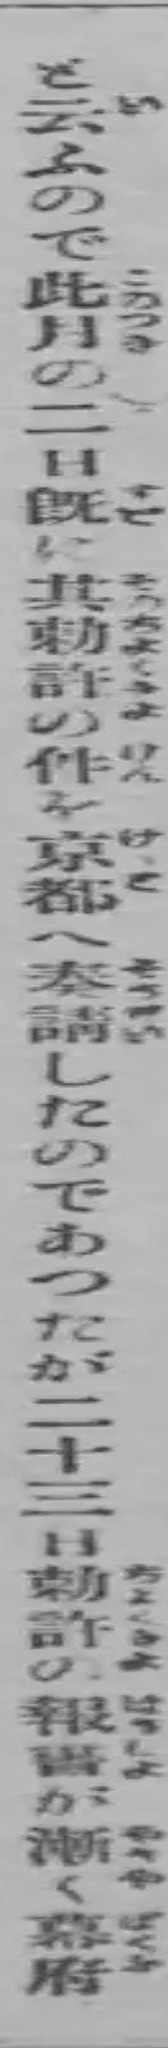と云ふので此月の二日既に其勅許の件を京都へ奏請したのであつたが二十三日勅許の報書が漸く幕府
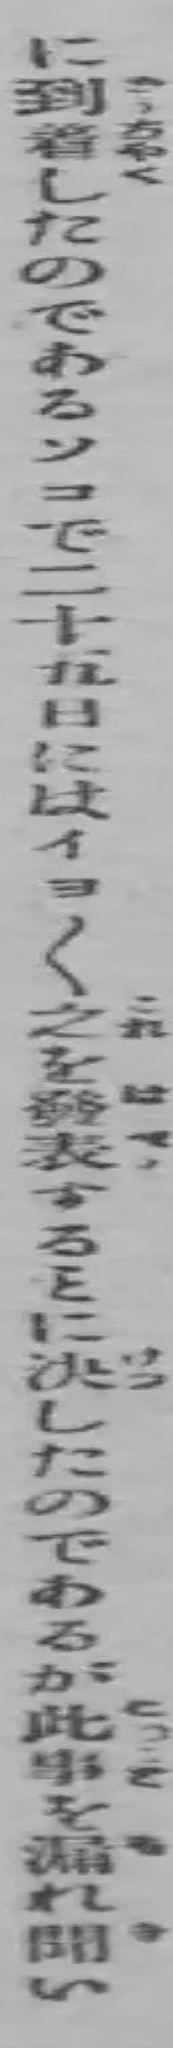に到着したのであるソコで二十五日にはイヨ〳〵之を発表することに決したのであるが此事を漏れ聞い
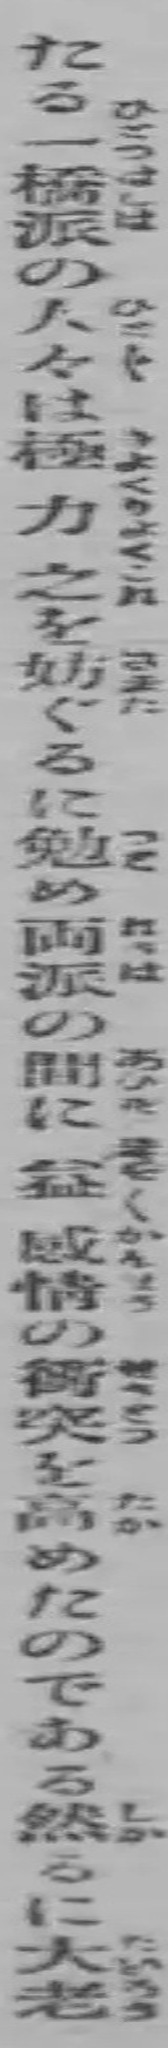たる一橋派の人々は極力之を妨ぐるに勉め両派の間に益感情の衝突を高めたのである然るに大老
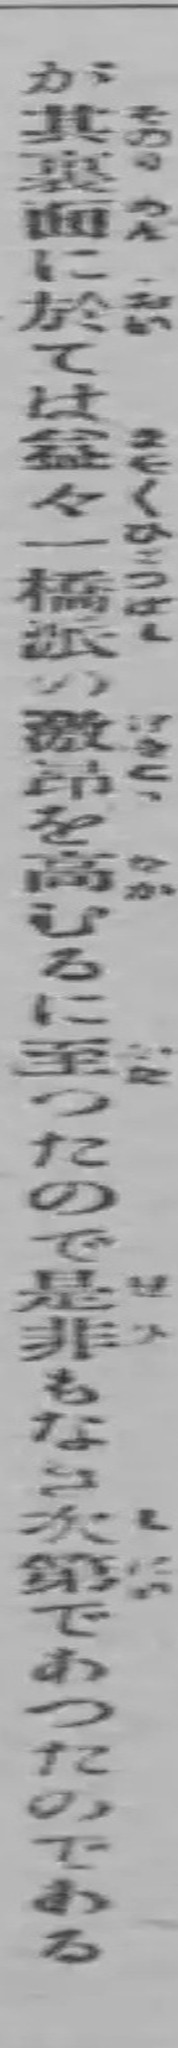が其裏面に於ては益々一橋派の激昂を高むるに至つたので是非もなき次第であつたのである
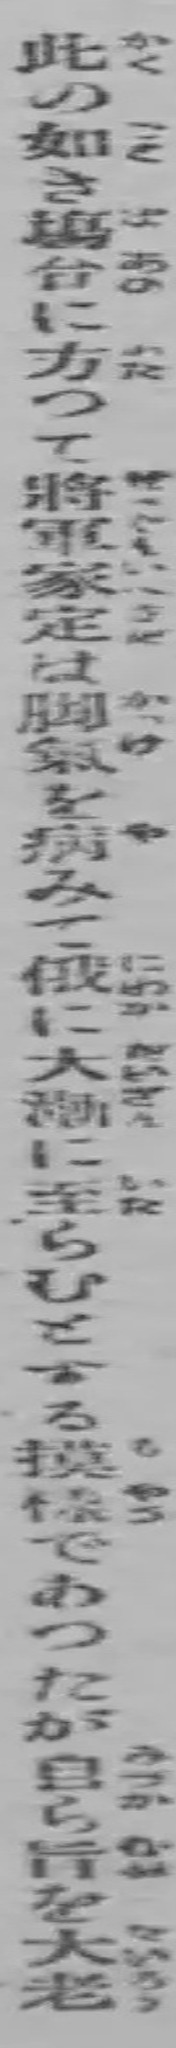此の如き場合に方つて将軍家定は脚気を病みて俄に大漸に至らむとする模様であつたが自ら旨を大老
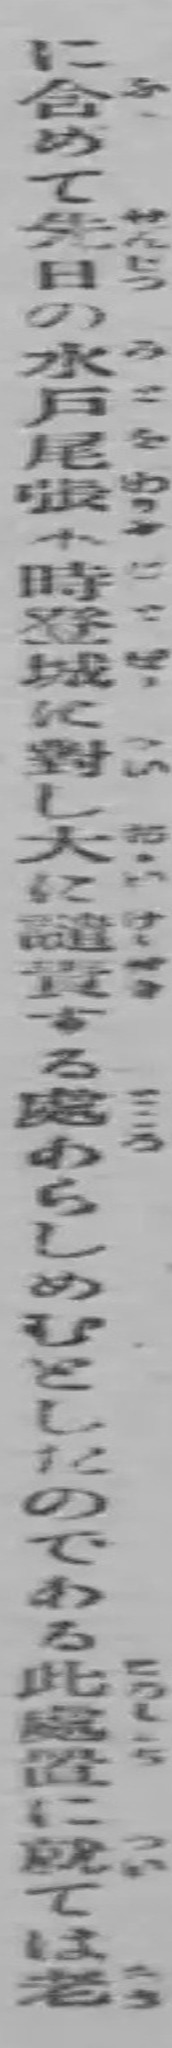に含めて先日の水戸尾張不時登城に対し大に譴責する処あらしめむとしたのである此処置に就ては老
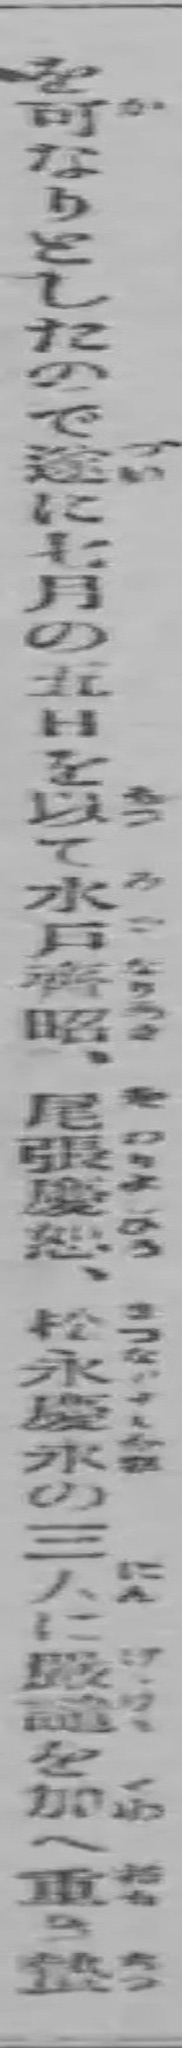を可なりとしたので遂に七月の五日を以て水戸斉昭、尾張慶恕、松永慶永の三人に厳譴を加へ重き蟄
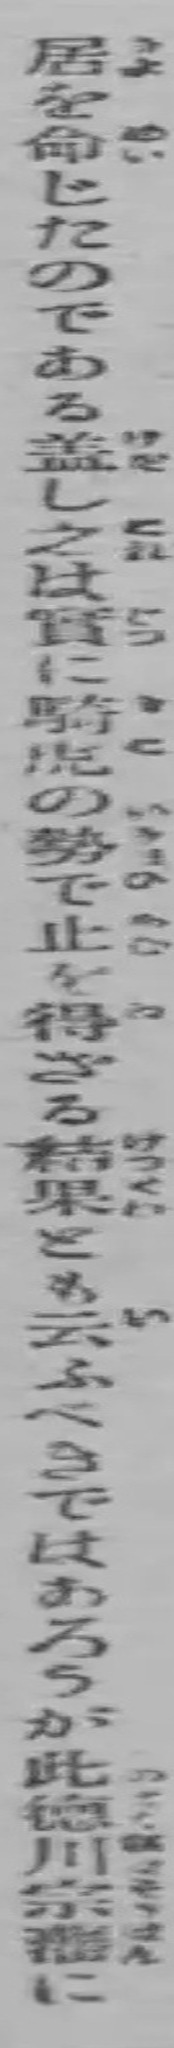居を命じたのである蓋し之は実に騎虎の勢で止を得ざる結果とも云ふべきではあろうが此徳川宗藩に
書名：豊橋市史談
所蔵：国立国会図書館 National Diet Library, JAPAN
